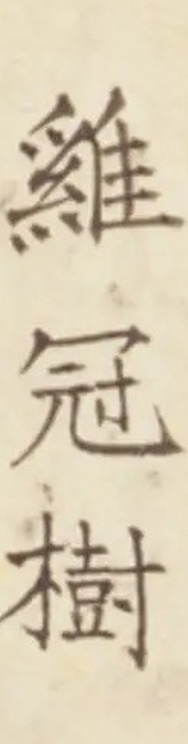雞冠樹
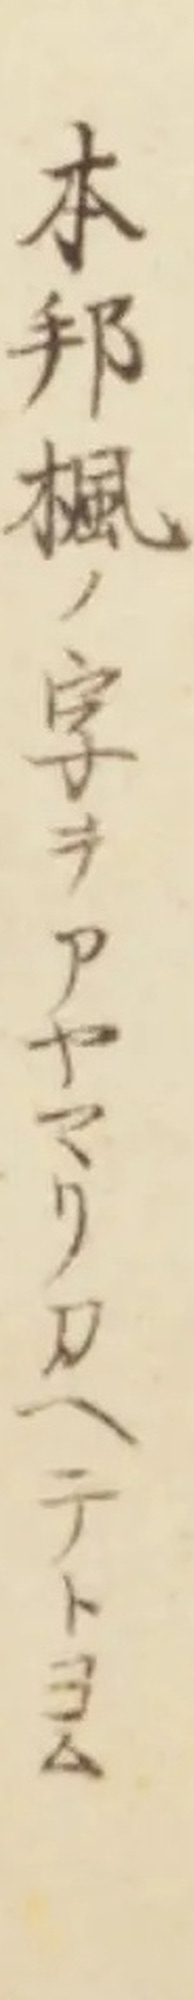本邦楓ノ字ヲアヤマリカヘテトヨム
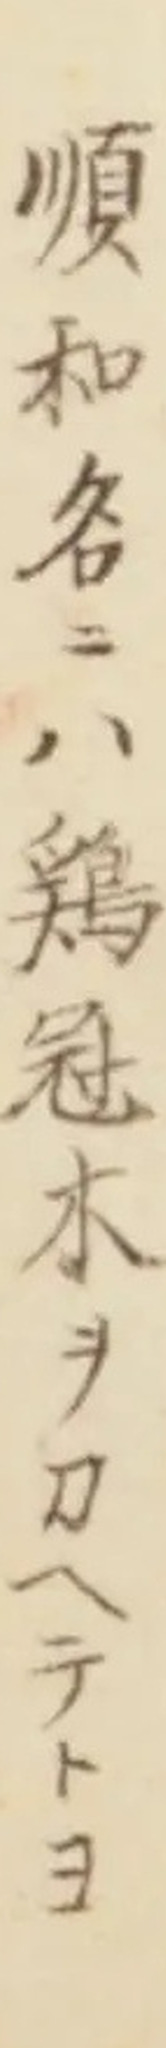順和名ニハ鶏冠木ヲカヘテトヨ
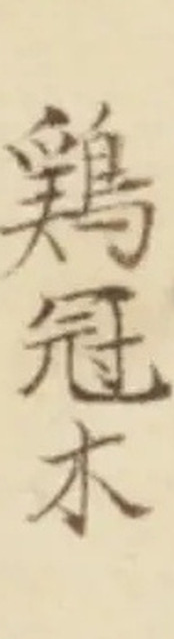鶏冠木
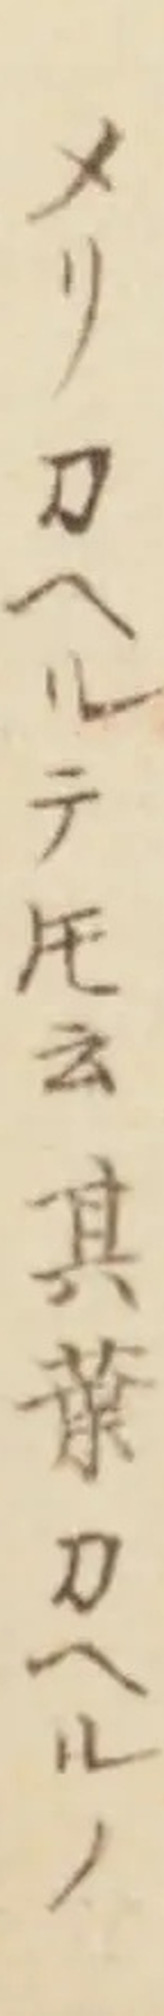メリカヘルテトモ云其葉カヘルノ
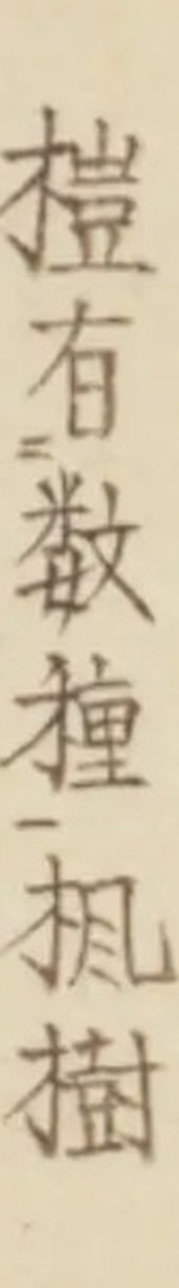榿有数種楓樹
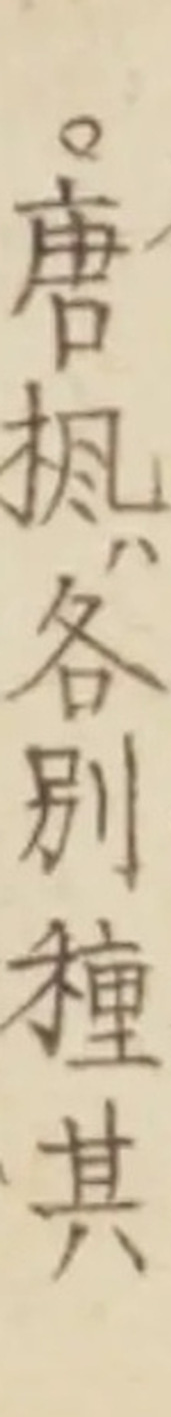◦唐楓各別種其
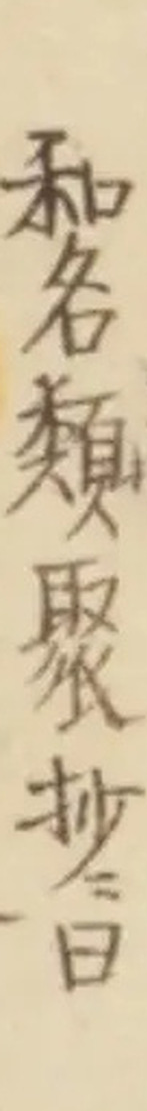和名類聚抄曰
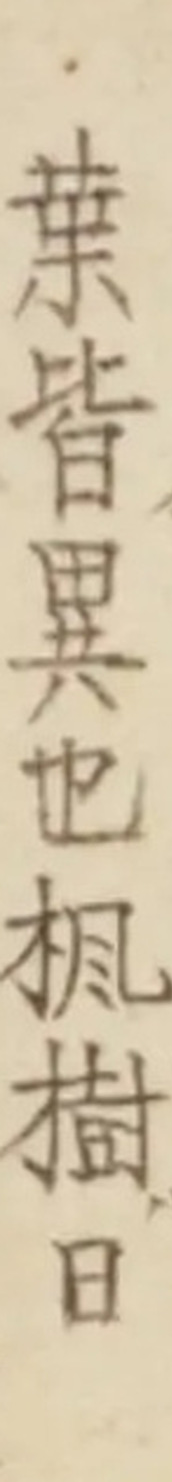葉皆異也楓樹日
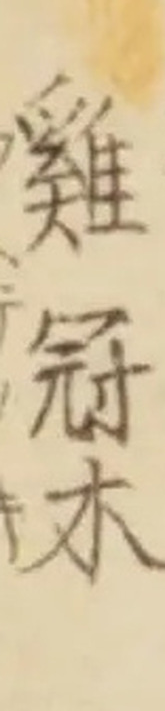鶏冠木
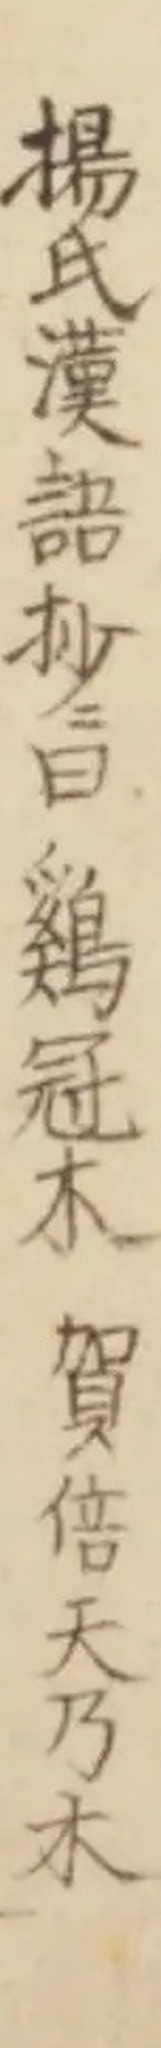楊氏漢語抄曰雞冠木加倍天乃木
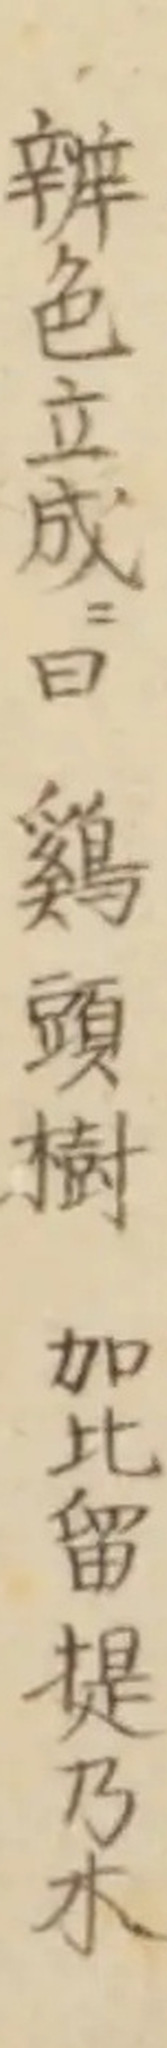弁色立成曰雞頭樹加比留提乃木
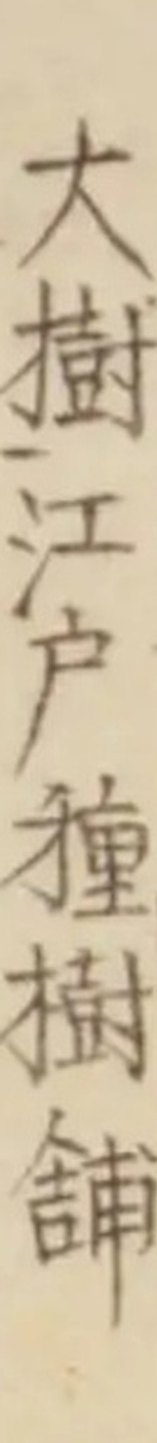大樹江戸種-樹-舗

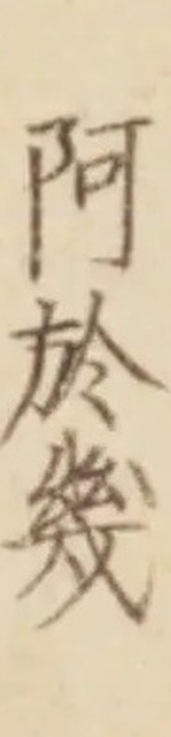阿於幾
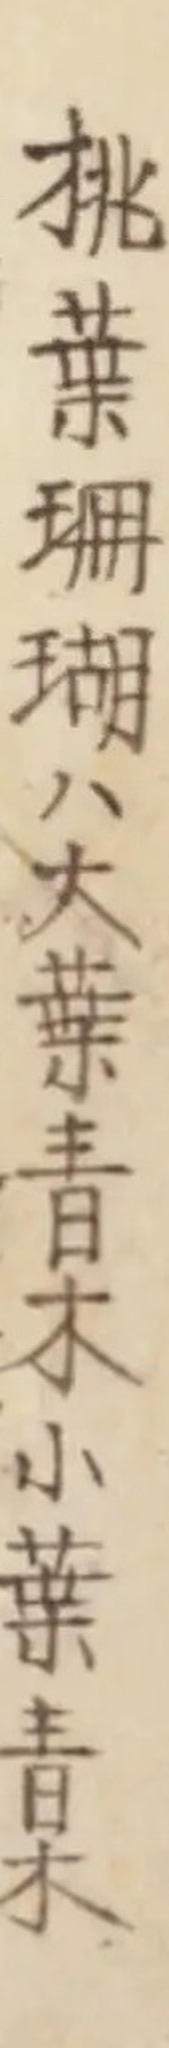桃葉珊瑚ハ大葉青木小葉青木
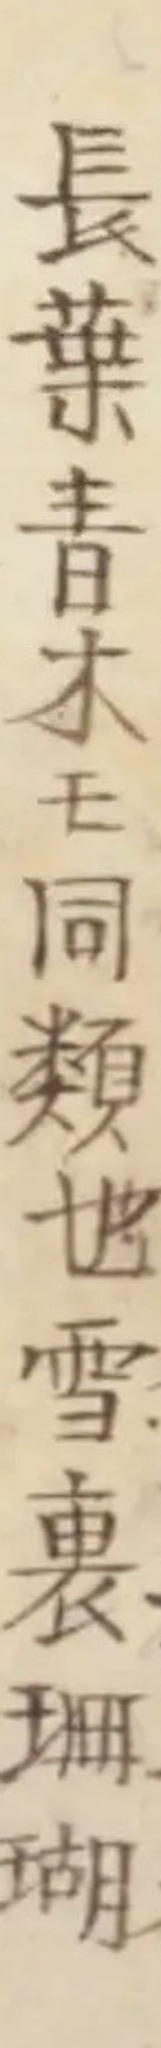長葉青木モ同類也雪裏珊瑚
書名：梅園草木花譜春之部. 1
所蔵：国立国会図書館 National Diet Library, JAPAN
